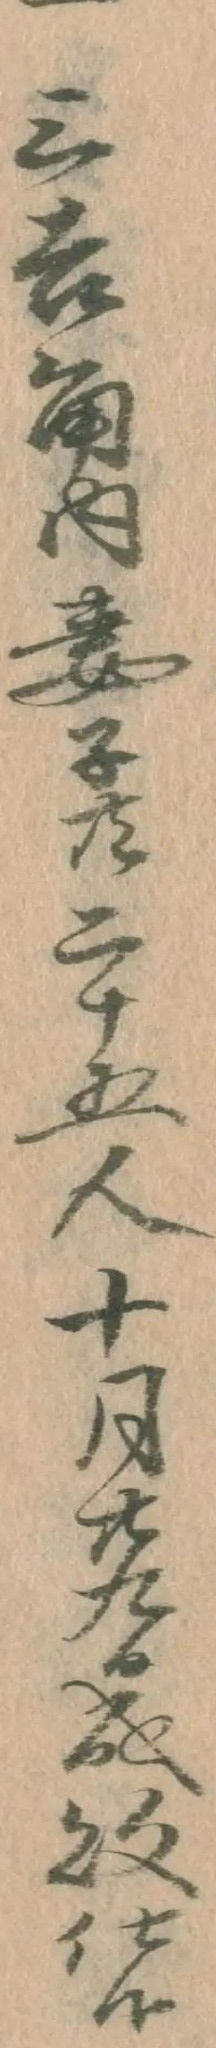一三吉角内妻子共二十五人十月廿九日成敗仕候
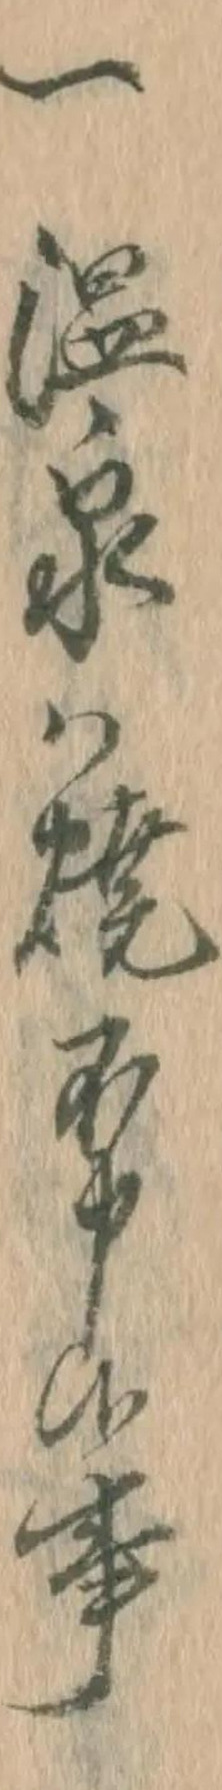一温泉は焼不申候事
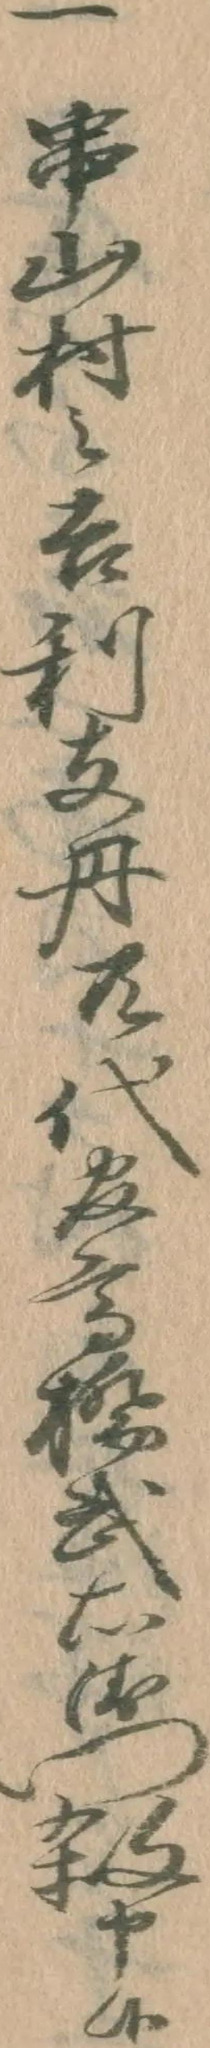一串山村之吉利支丹共代官高橋武右衛門殺申候
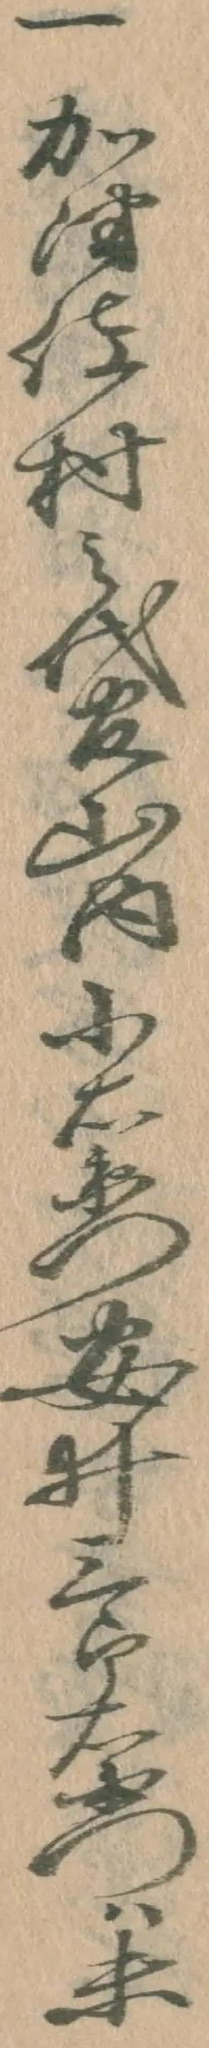一加津佐村之代官山内小右衛門安井三郎右衛門は未
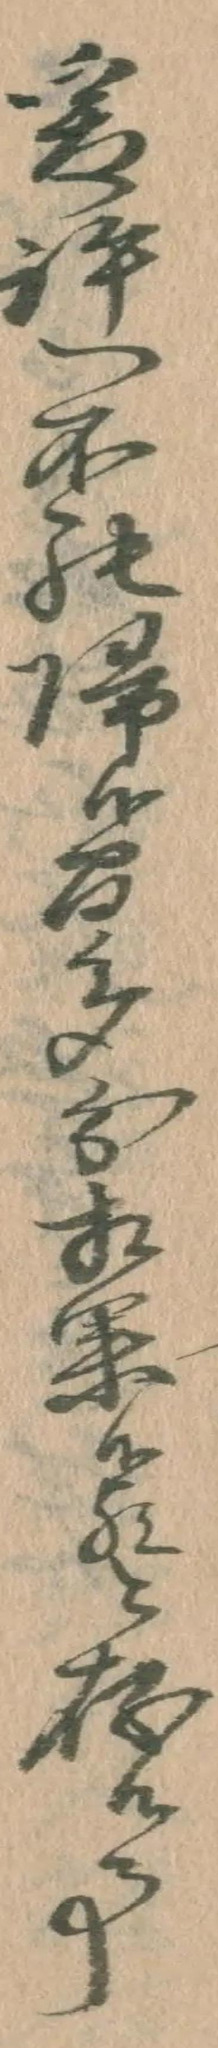爰許へ不罷帰候間多分相果候歟と存候事
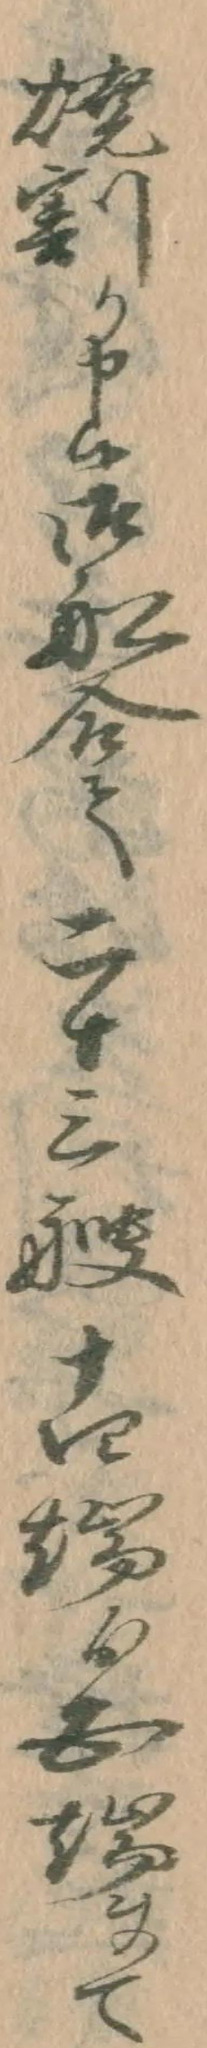一焼割り申候御舩合て二十三艘十四端ゟ五端まて
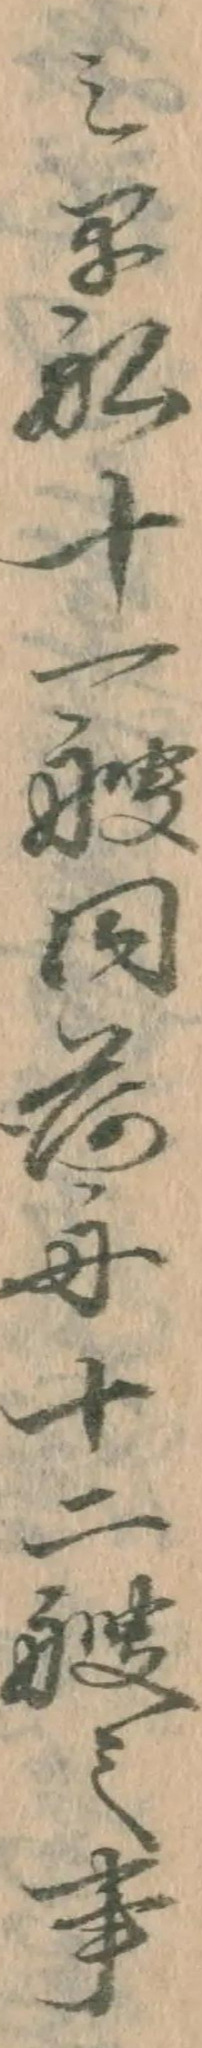之早舩十一艘同落舟十二艘之事
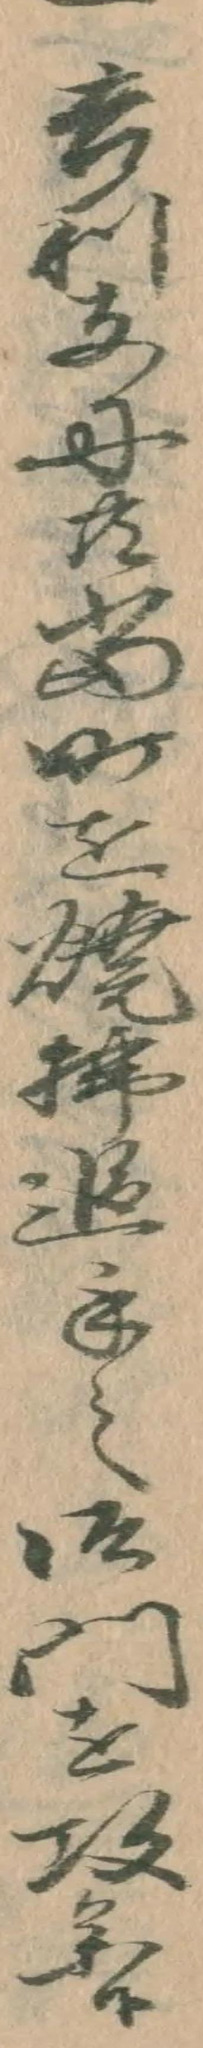一吉利支丹共当町を焼払追手之御門を攻参候
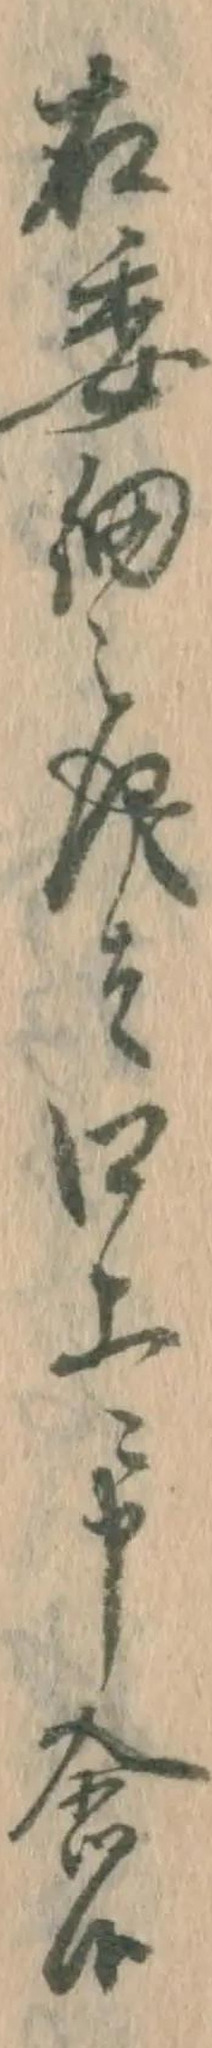右委細之義者口上に申合候
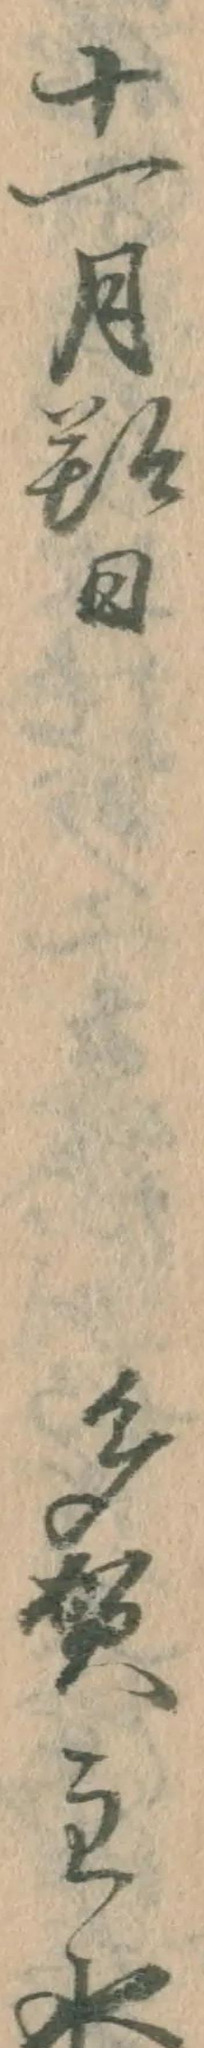十一月朔日多賀主水
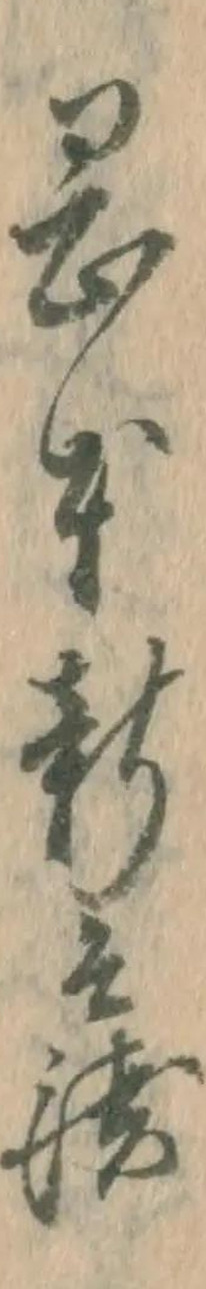岡本新兵衛
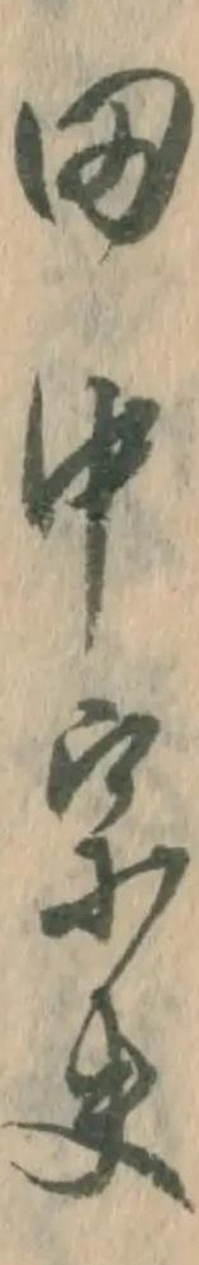田中宗夫

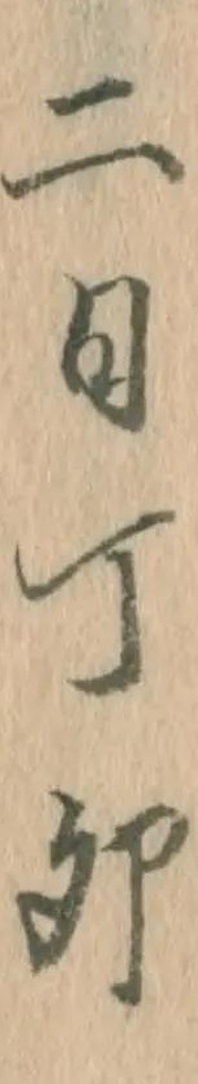二日丁夘
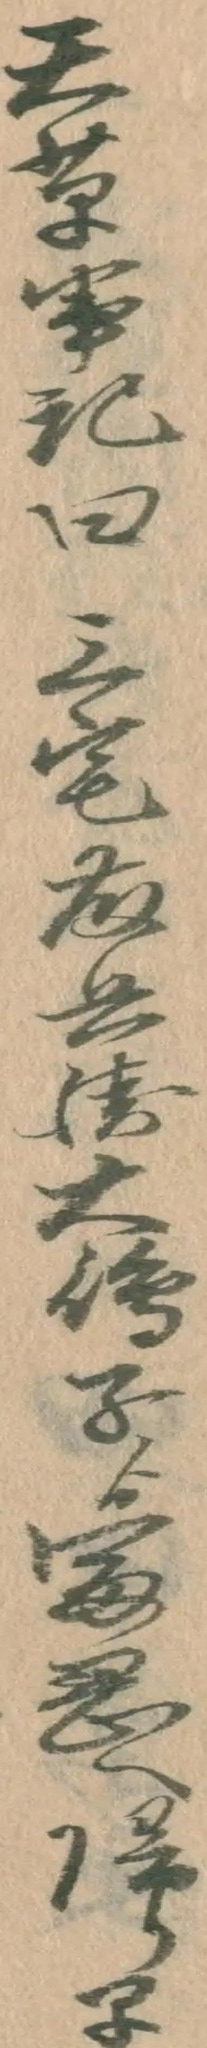天草軍記曰三宅藤兵衛大島子ゟ冨岡へ帰り早
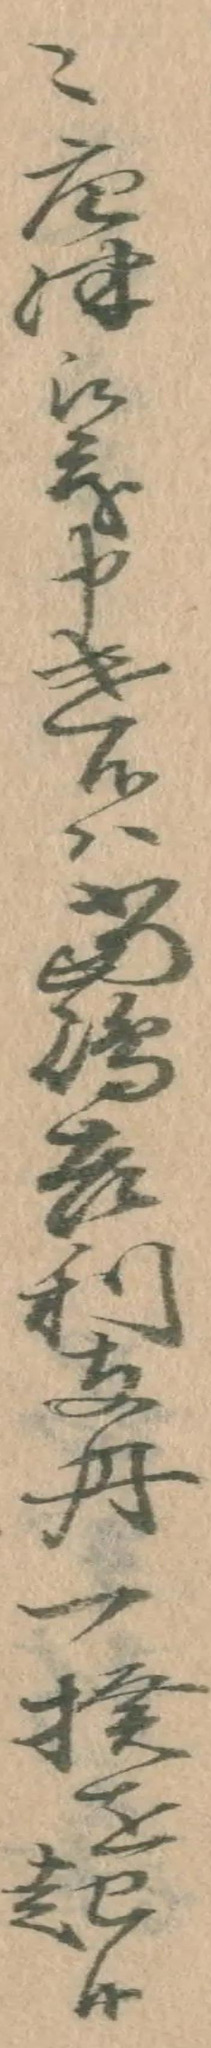々唐津江義申遣候は当島吉利支丹一揆を起候
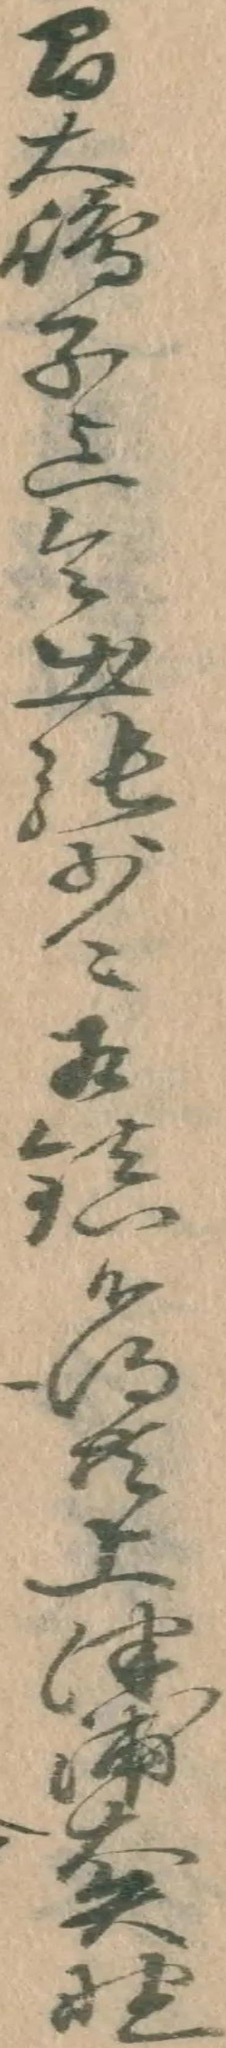間大島子迄令出張少々相鎮候得共上津浦大矢野
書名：切支丹御退治記 49巻. [2]
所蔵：国立国会図書館 National Diet Library, JAPAN
